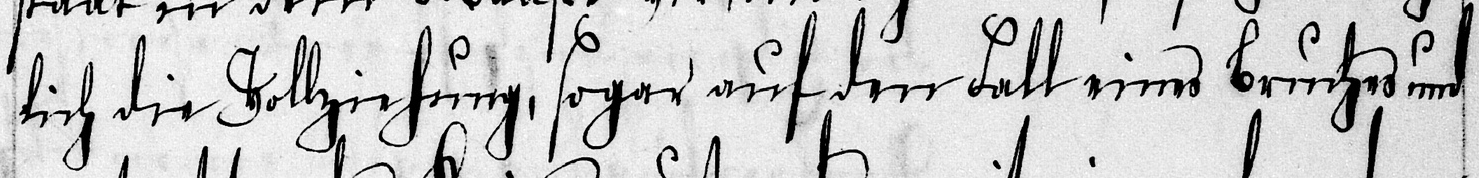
lich die Vollziehung, sogar auf den Fall eines Bruches und
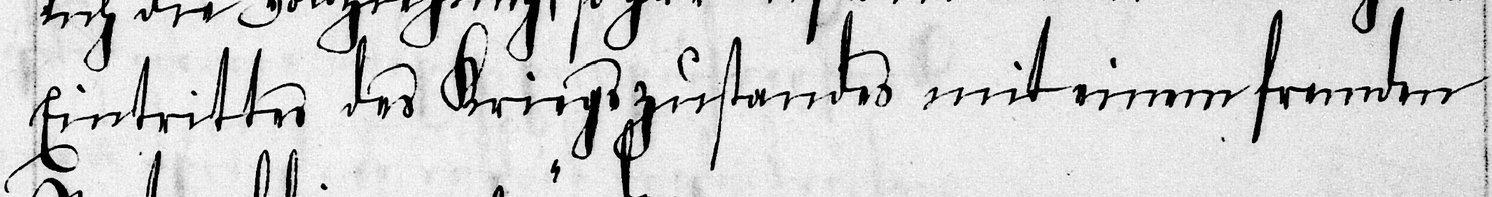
Eintrittes des Kriegszustandes mit einem fremden
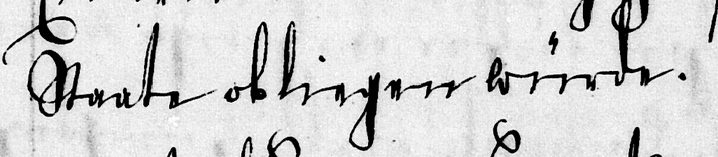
Staate obliegen würde.
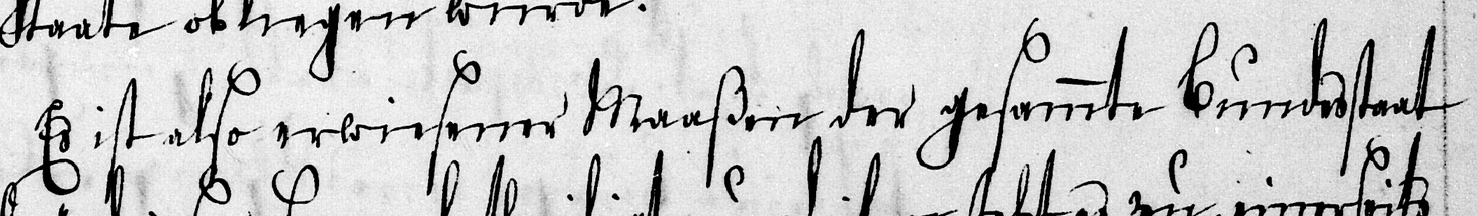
ist also erwiesener Maaßen der gesammte Bundesst¬
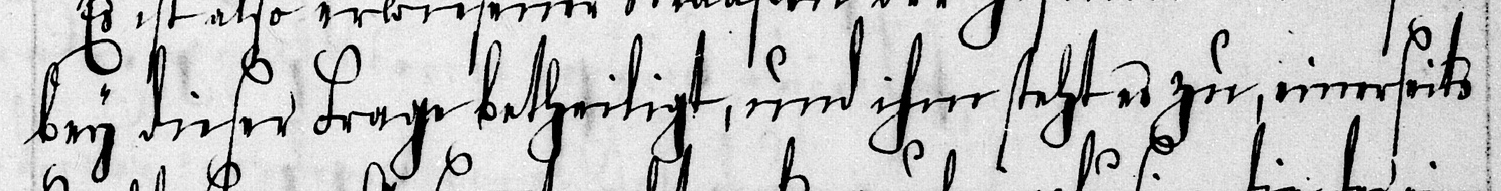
bey dieser Frage betheiligt, und ihm steht es zu, einerseits
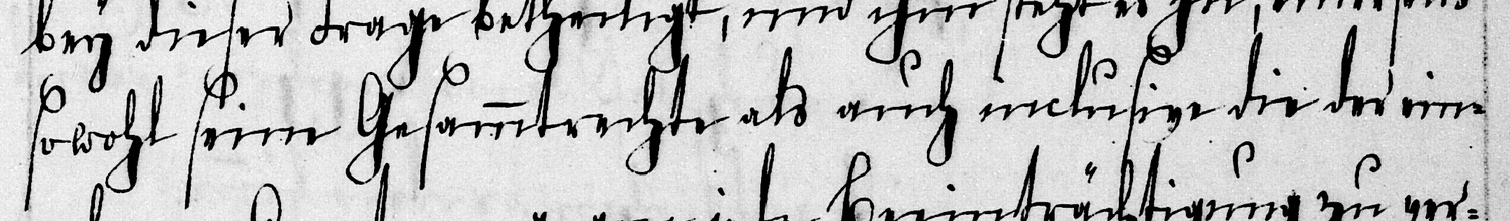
sowohl seine Gesammtrechte als auch inclusive die der ein¬
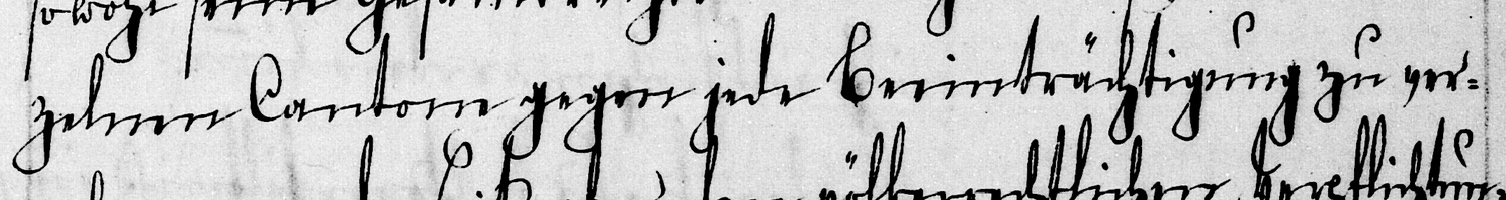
zelnen Cantone gegen jede Beeinträchtigung zu ver¬
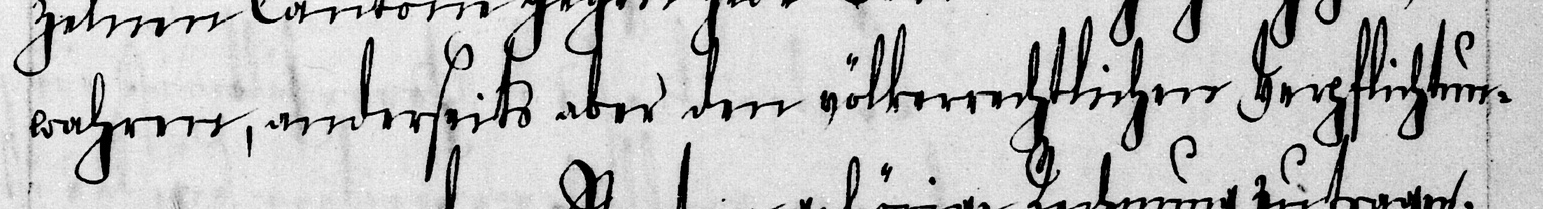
wahren, anderseits aber den völkerrechtlichen Verpflichtun¬
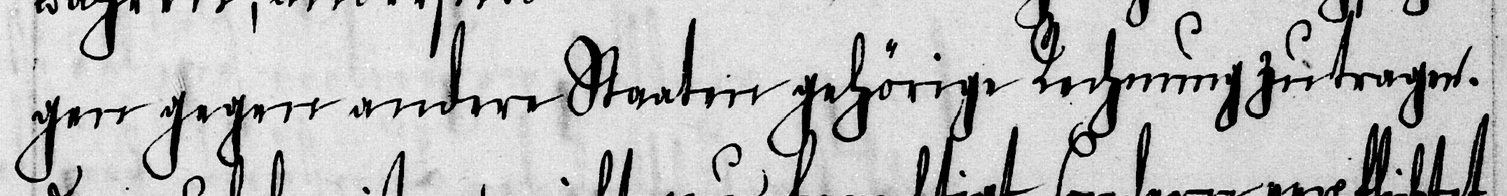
gen gegen andere Staaten gehörige Rechnung zu tragen.
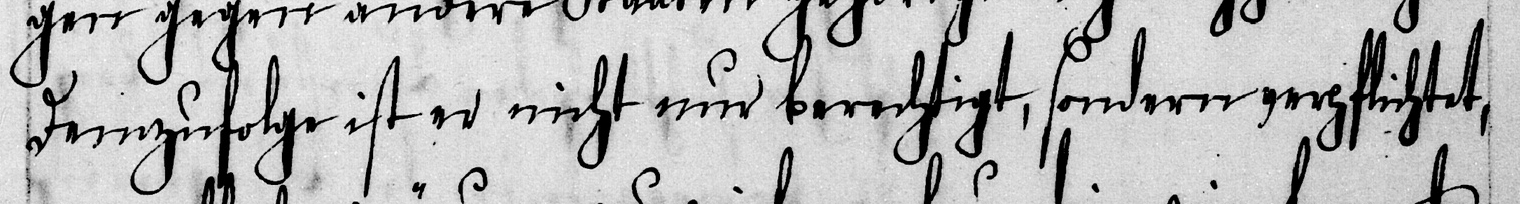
Demzufolge ist er nicht nur berechtigt, sondern verpflichtet,
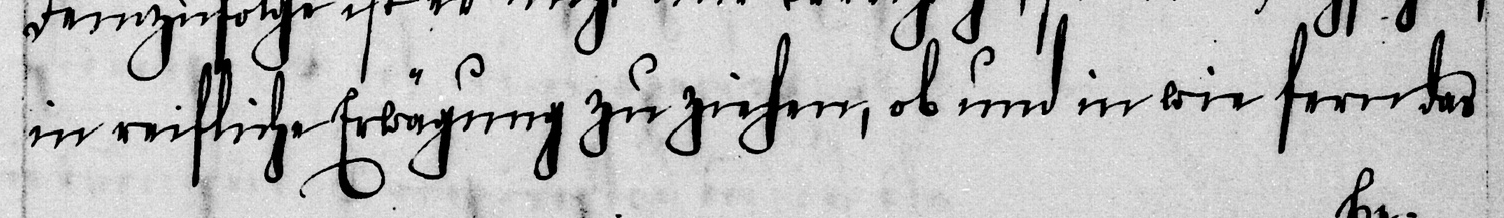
in reifliche Erwägung zu ziehen, ob und in wie fern das
